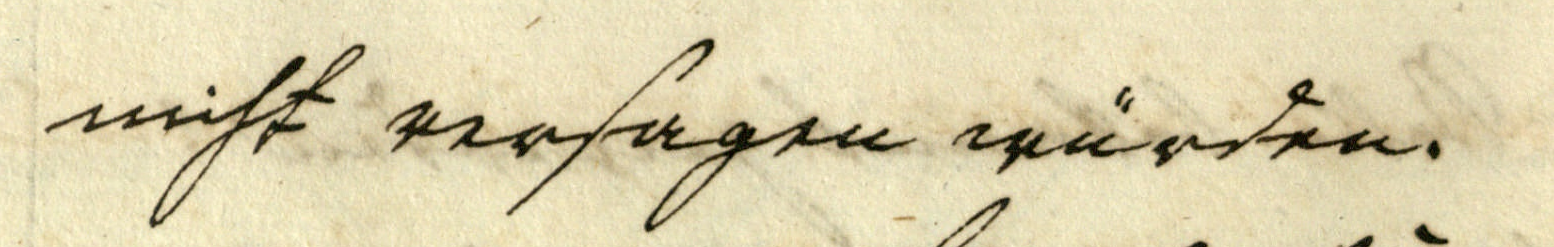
nicht versagen würden.
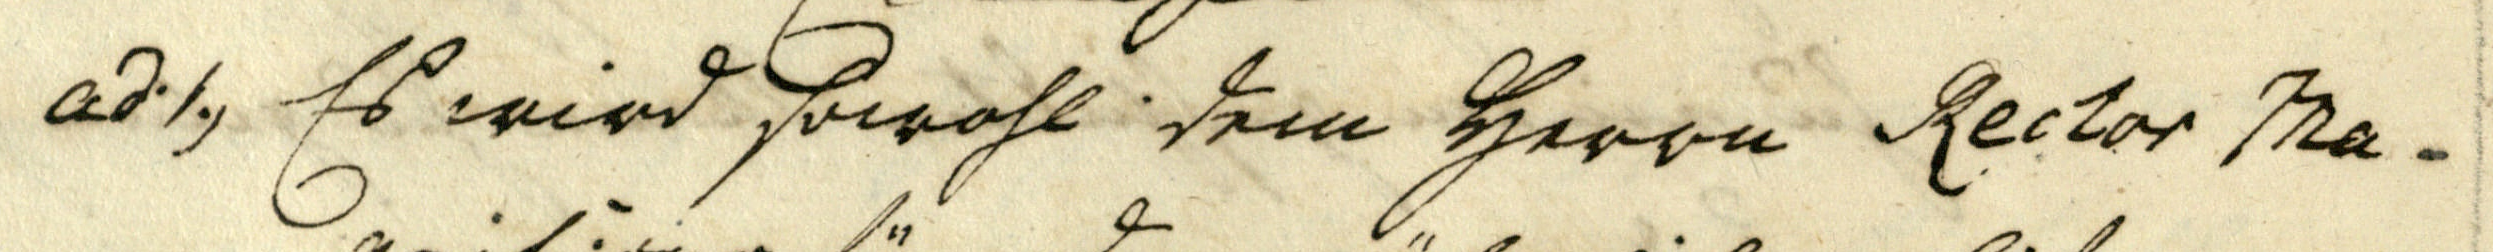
ad 1., Es wird sowohl dem Herrn Rector Ma¬
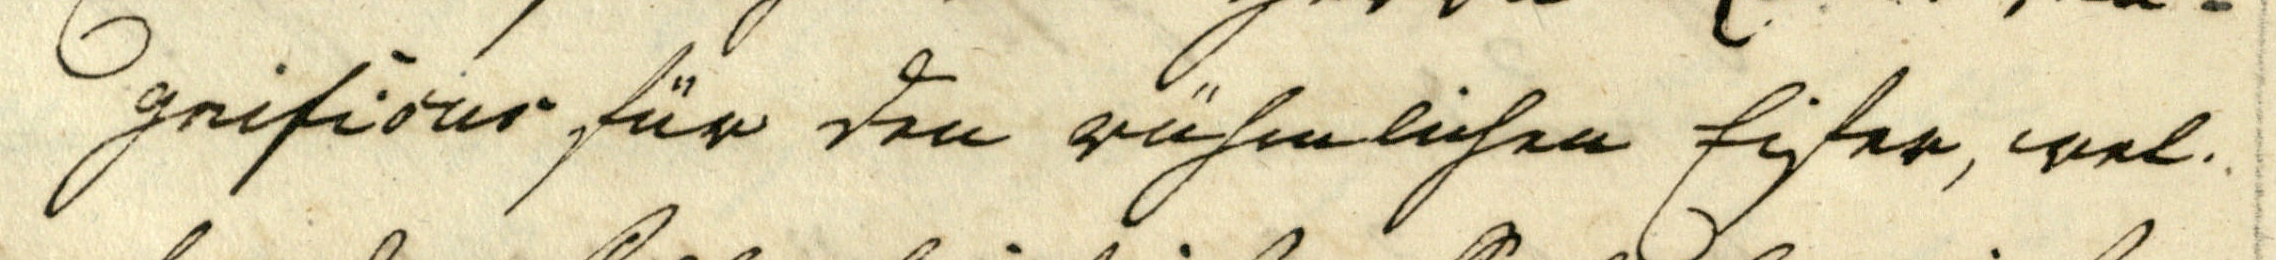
gnificus für den rühmlichen Eifer, wel¬
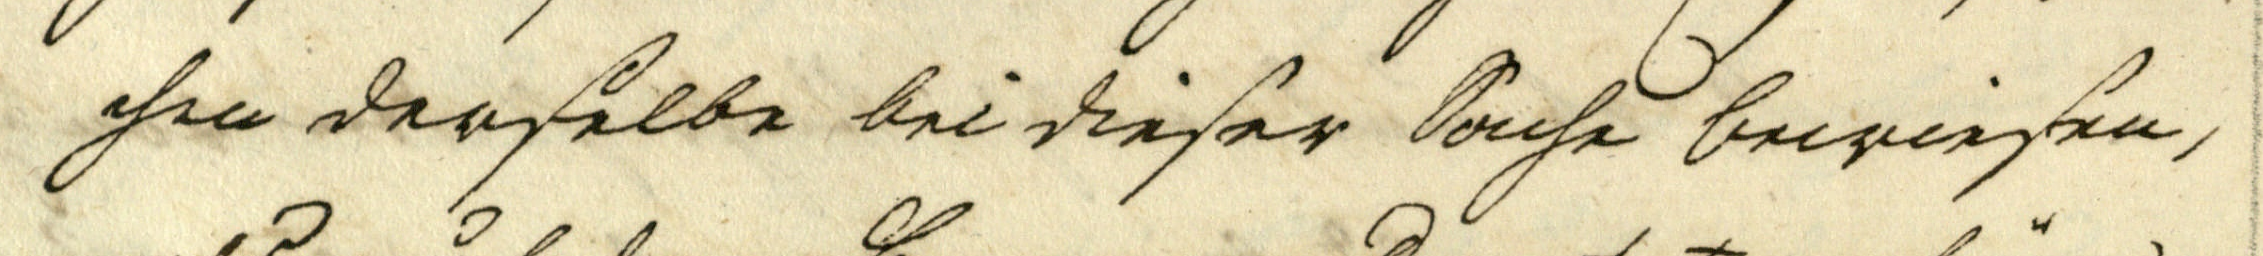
chen derselbe bei dieser Sache bewiesen,
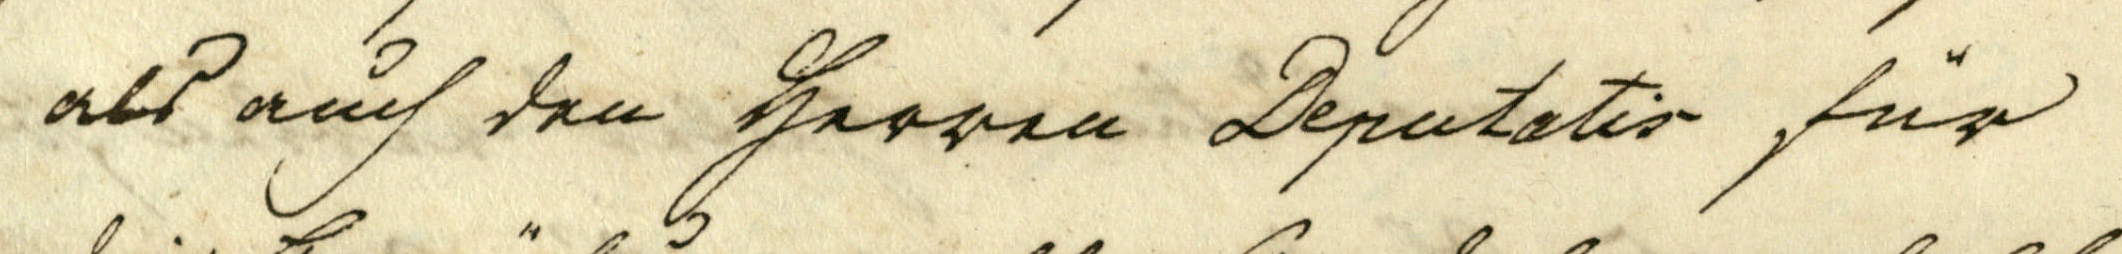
als auch den Herren Deputatis für
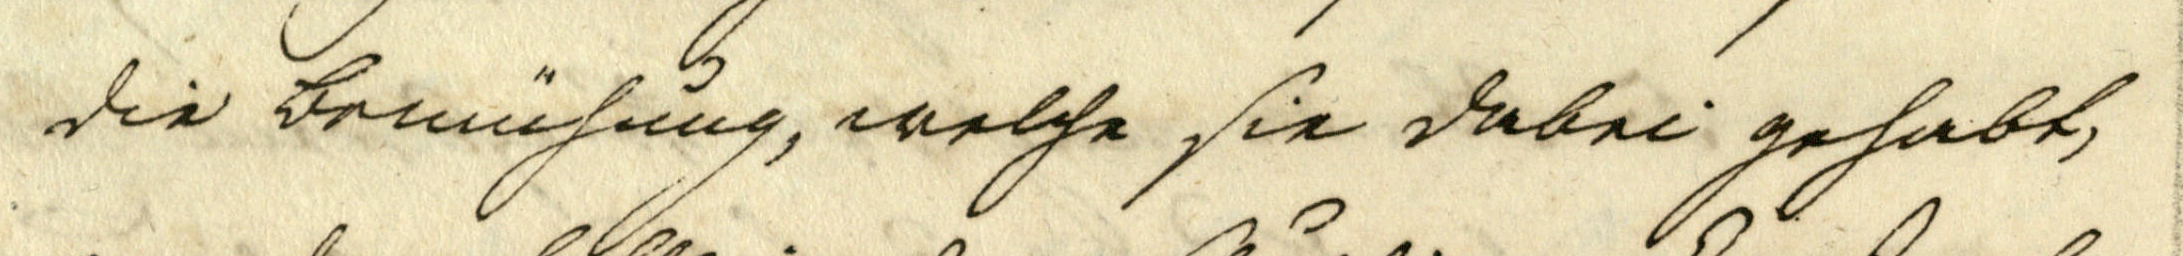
die Bemühung, welche sie dabei gehabt,
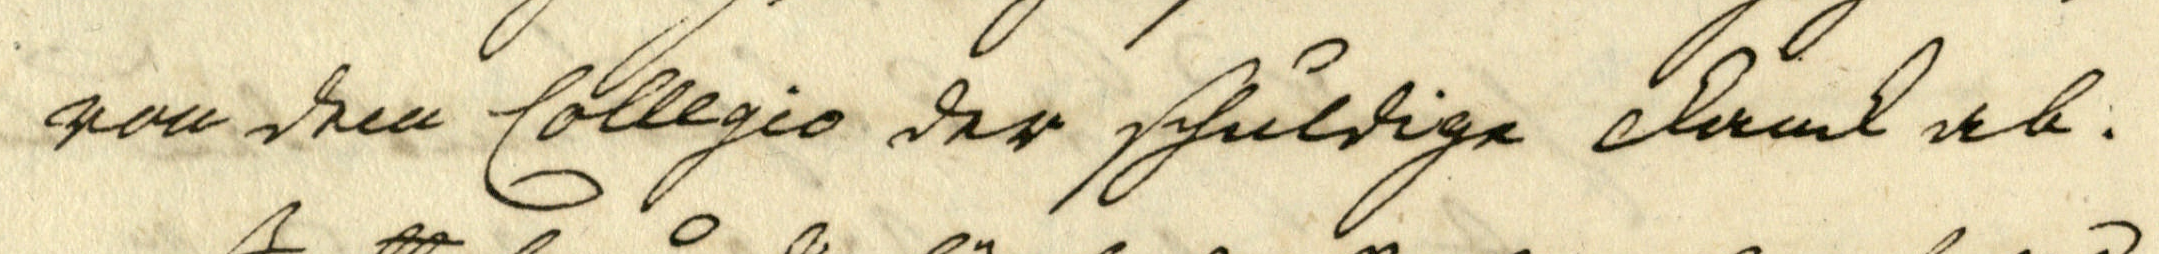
von dem Collegio der schuldige Danck ab¬
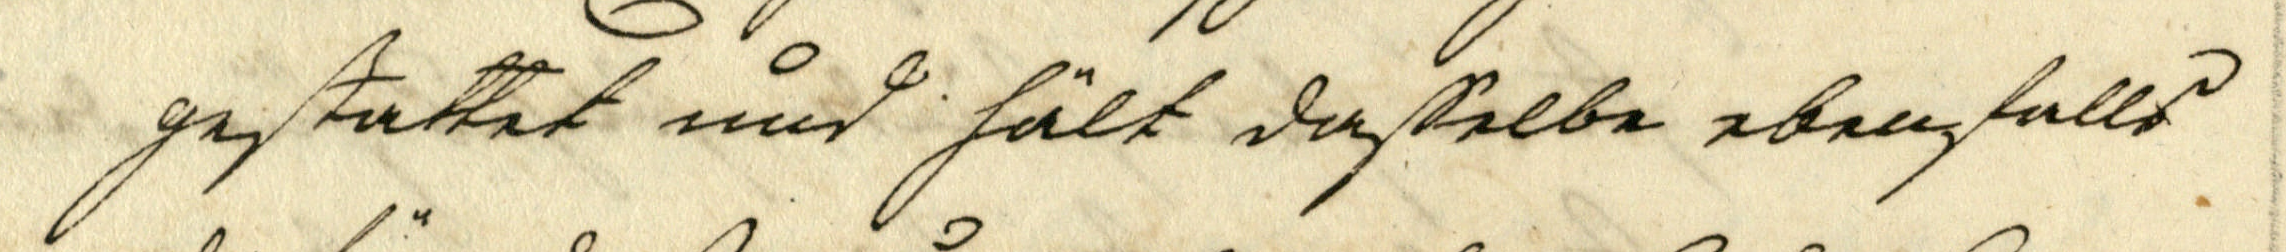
gestattet und hält dasselbe ebenfalls
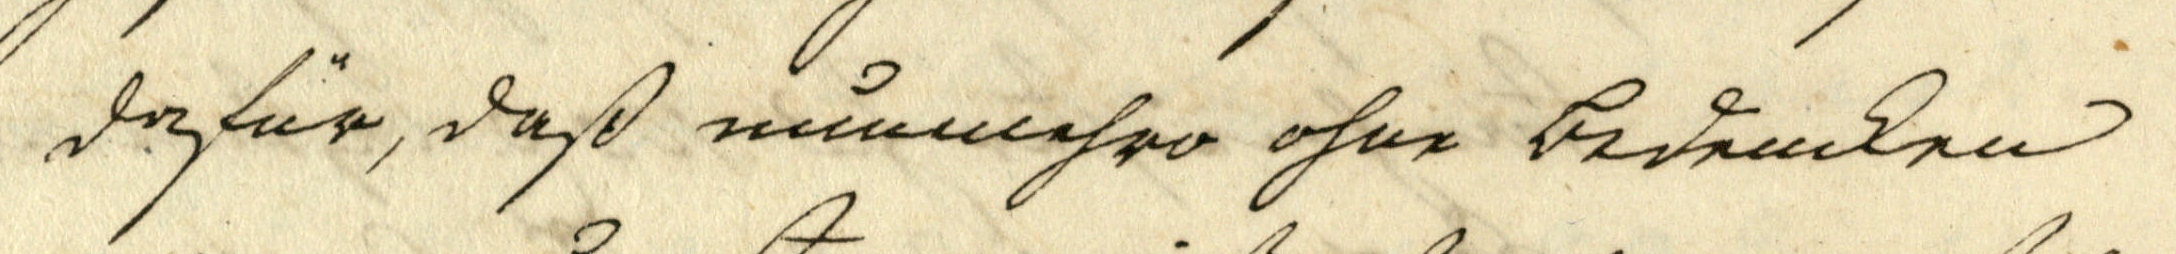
dafür, daß nunmehro ohne Bedencken
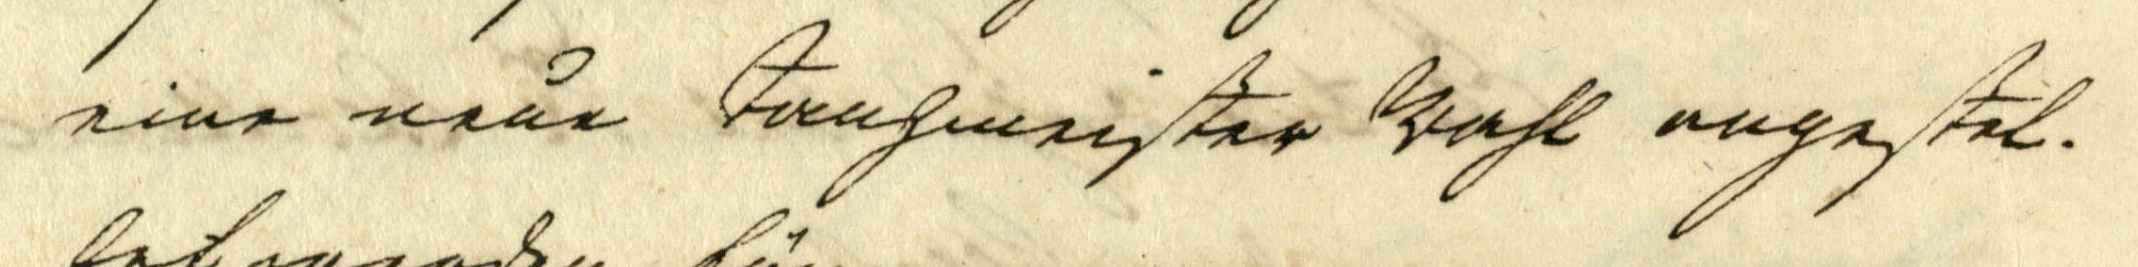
eine neue Tanzmeister Wahl angestel¬
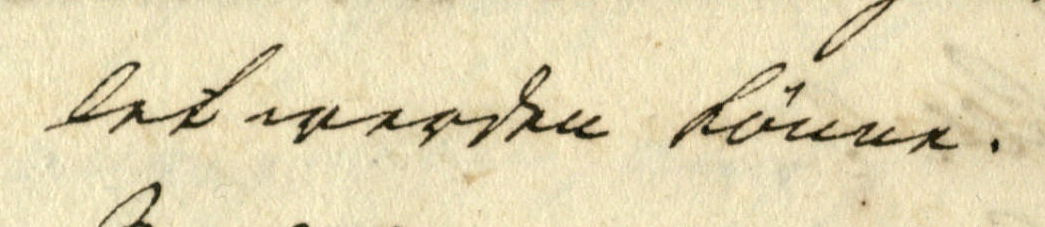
let werden könne.
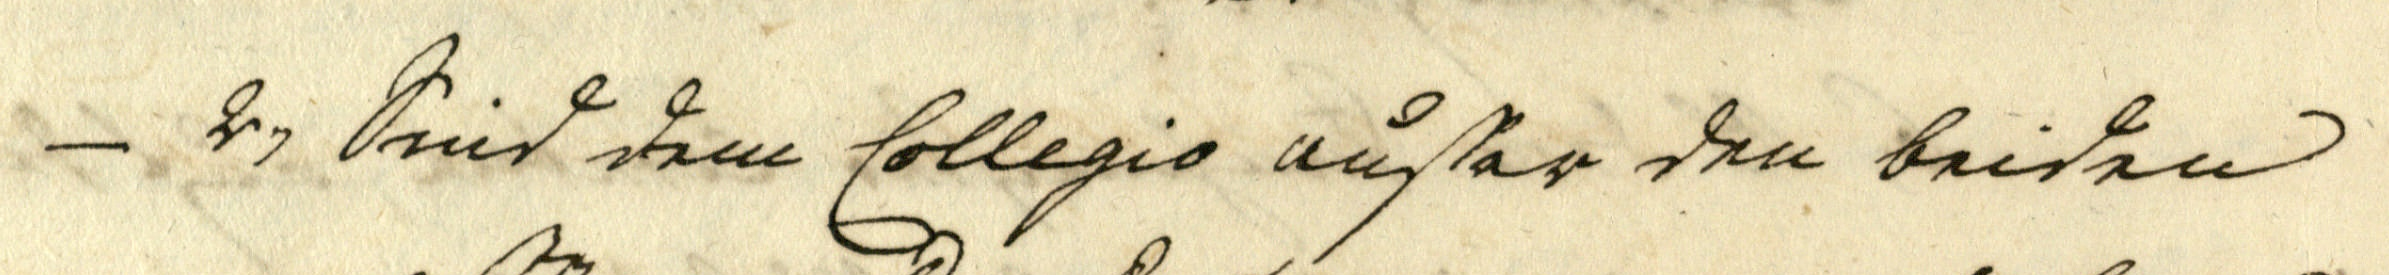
2., Sind dem Collegio ausser den beiden
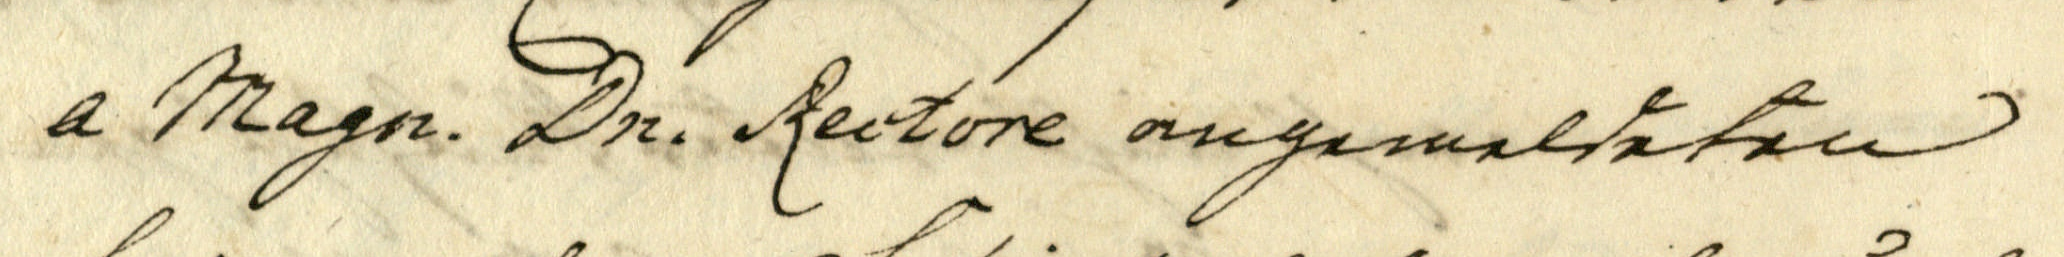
a Magn. Dn. Rectore angemeldeten
